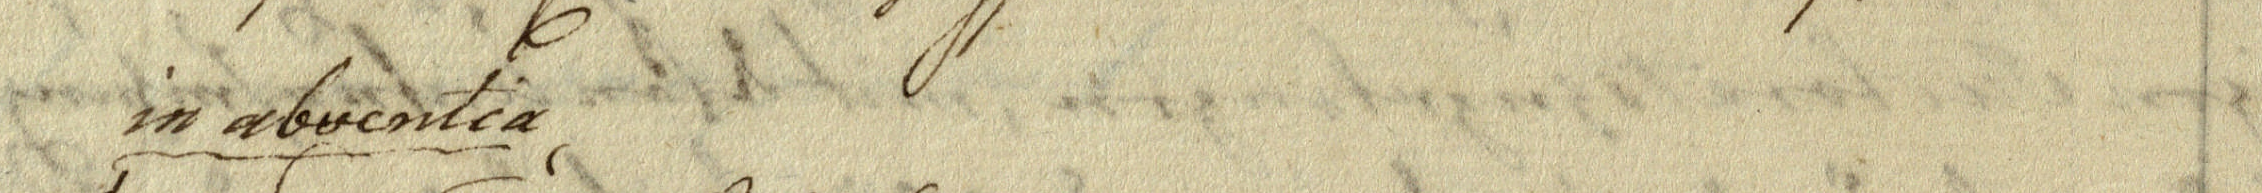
in absentia
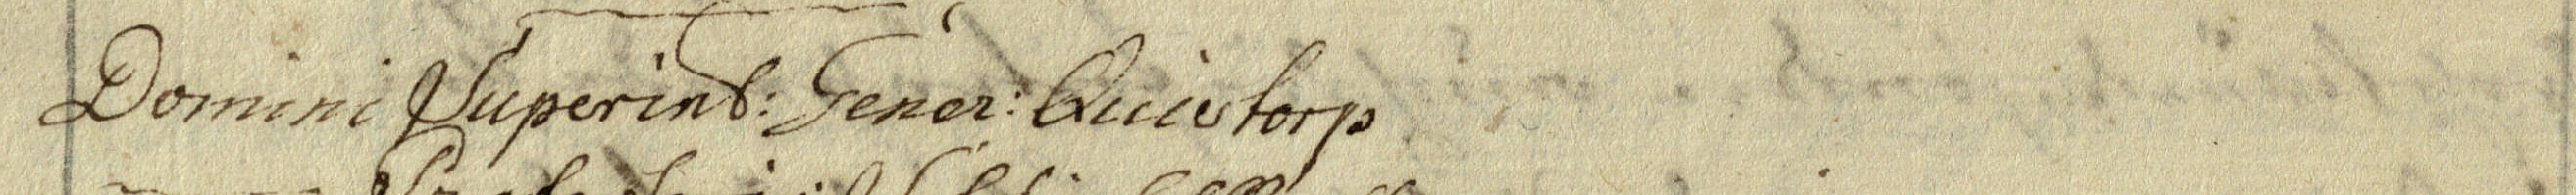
Domini Superint: Gener: Quistorp
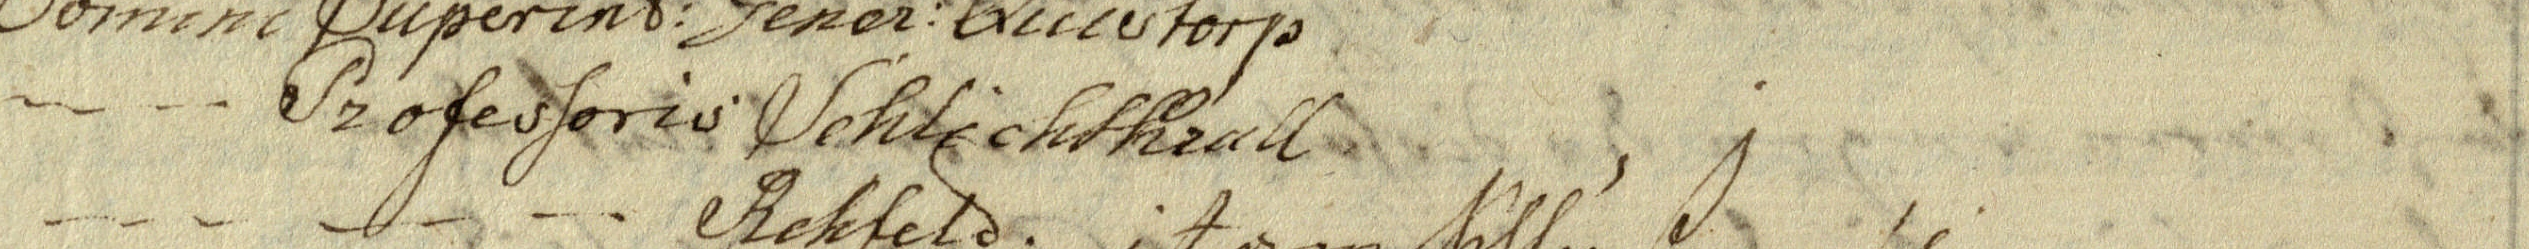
Professoris Schlichtkrull
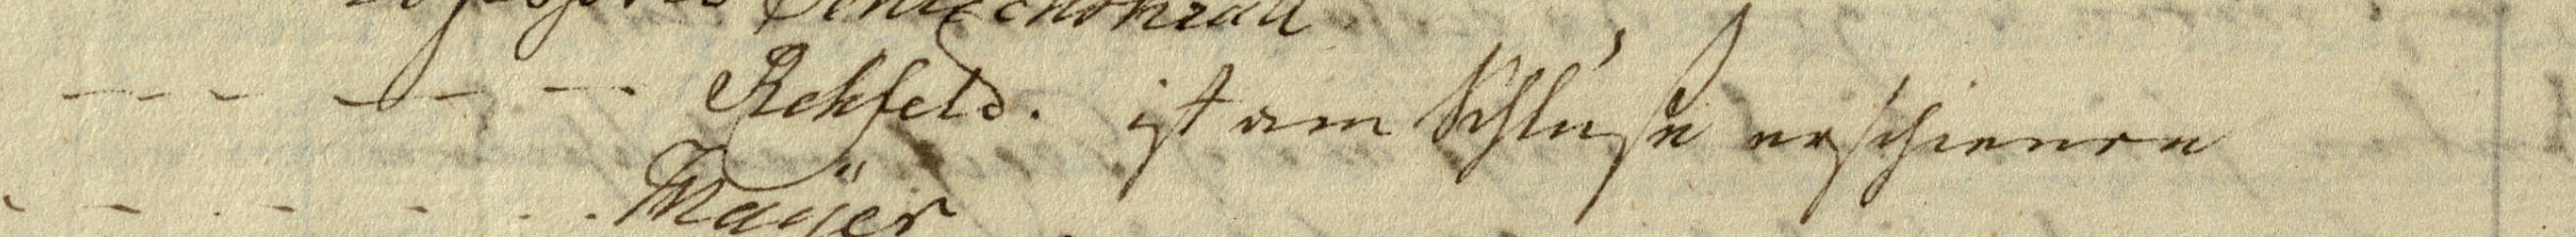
Rehfeld ist am Schluße erschienen
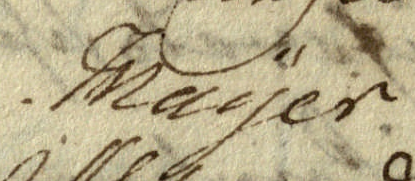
Maÿer
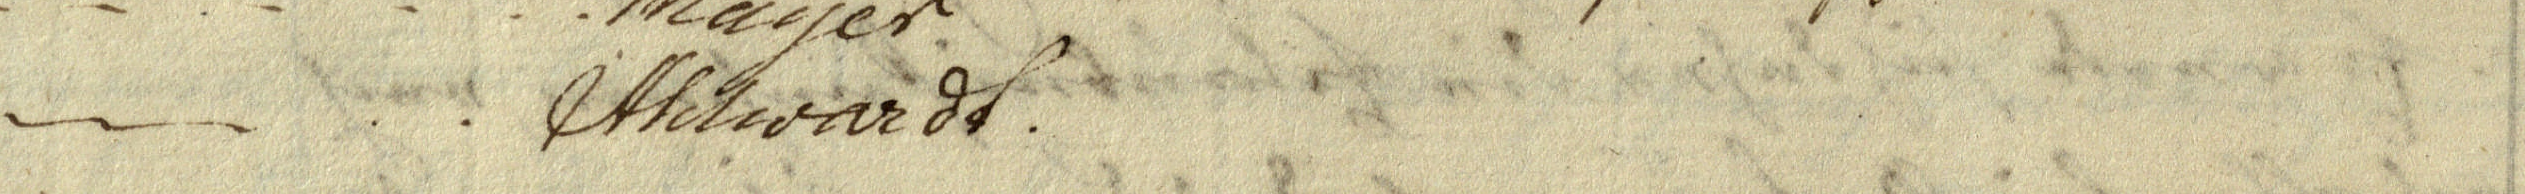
Ahlwardt.
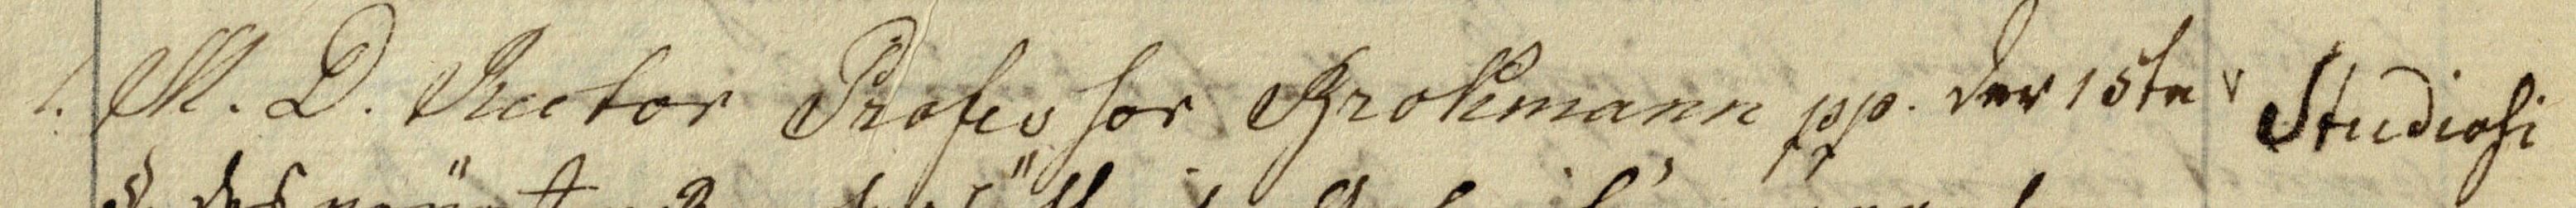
1. M.D. Rector Professor Brokmann pp. der 1 ste Studiosi
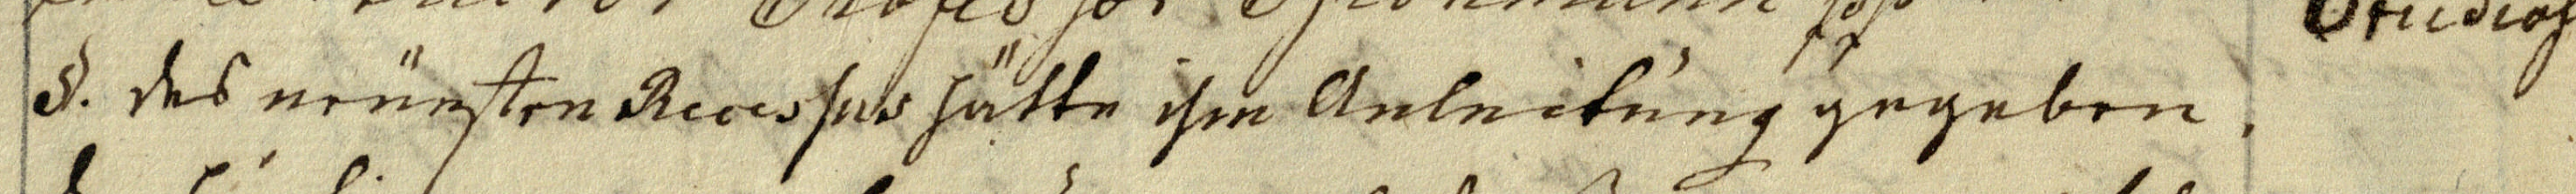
§ des neuesten Recesses hatte ihm Anleitung gegeben,
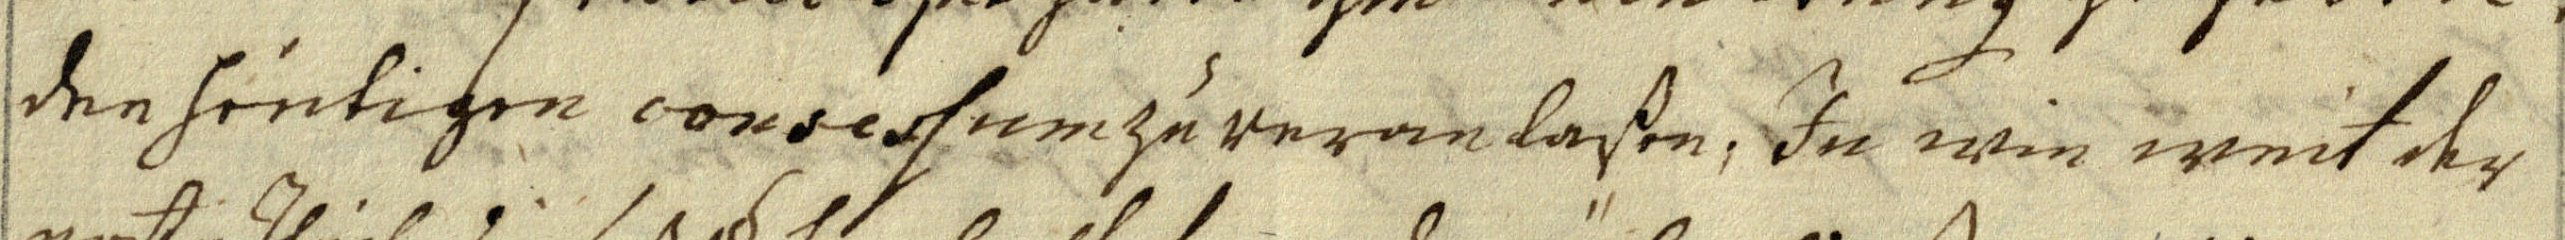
den heutigen consessum zu veranlaßen. In wie weit der
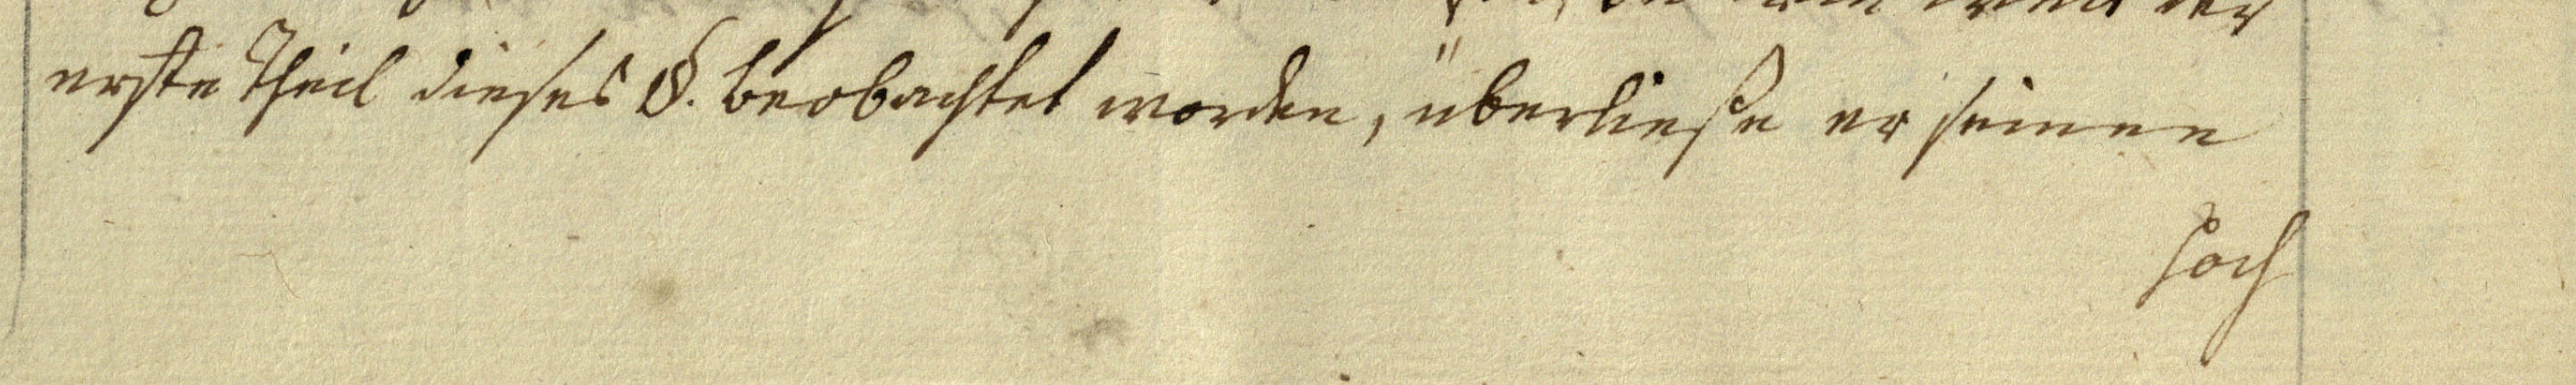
erste Theil dieses § beobachtet worden, überließe er seinen
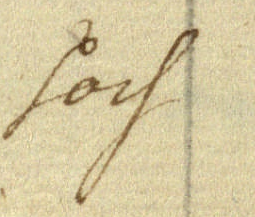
hoch
